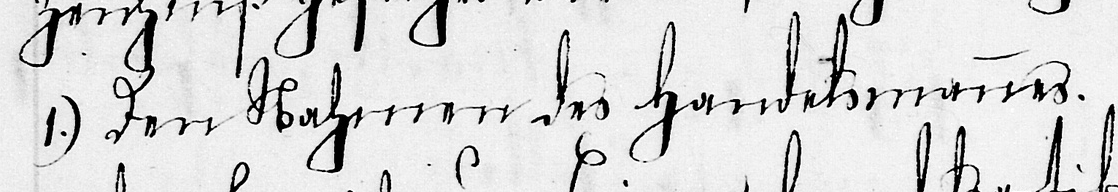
1.) Den Nahmen des Handelsmannes.
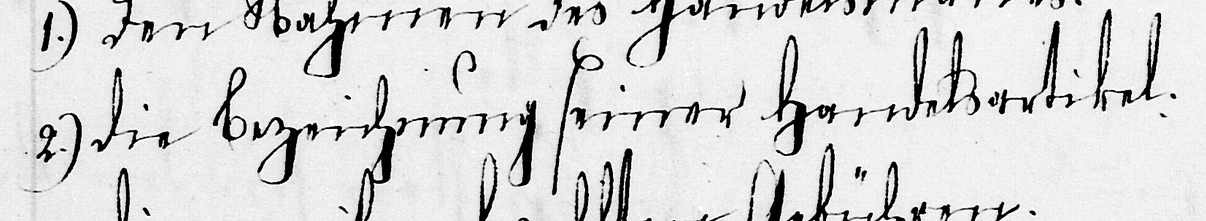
2.) die Bezeichnung seiner Handelsartikel.
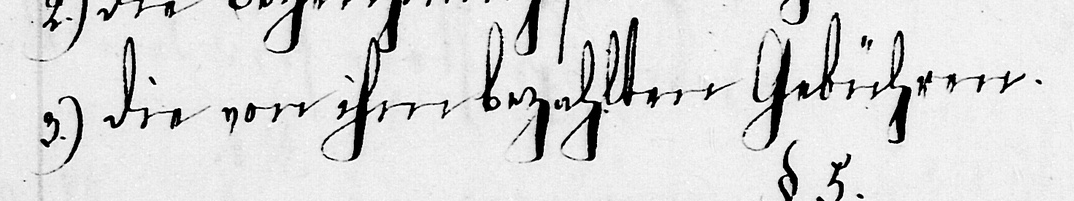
3.) die von ihm bezahlten Gebühren.
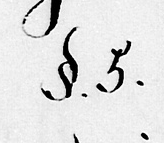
§. 5.
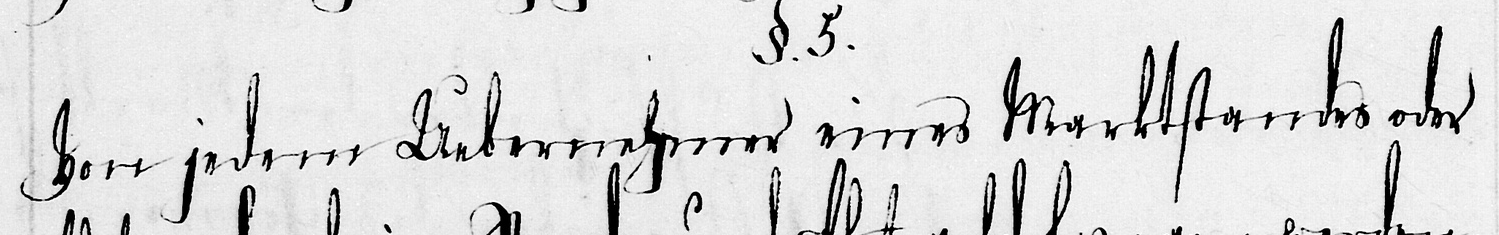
Von jedem Uebernehmer eines Marktstandes oder
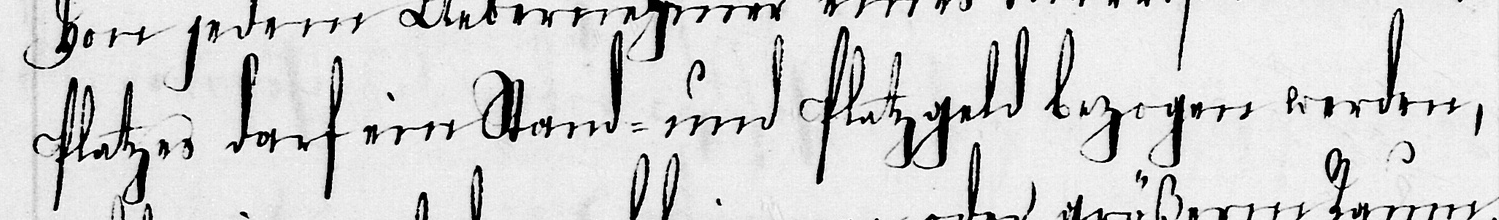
Platzes darf ein Stand- und Platzgeld bezogen werden,
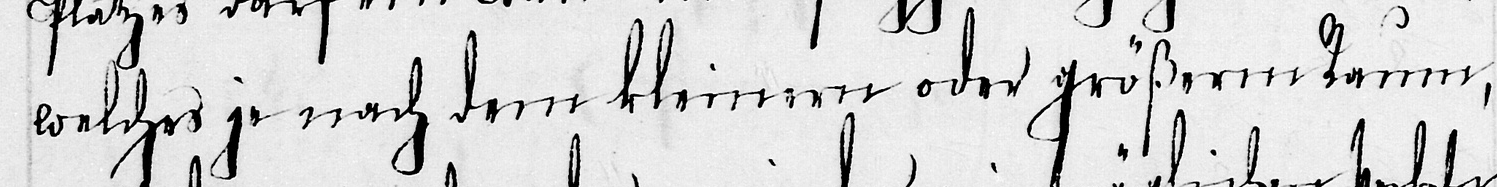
welches je nach dem kleinern oder größerm Raum,
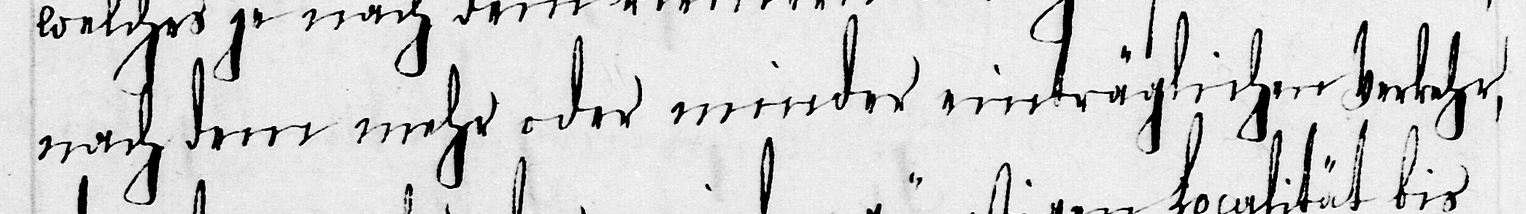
nach dem mehr oder minder einträglichen Verkehr,
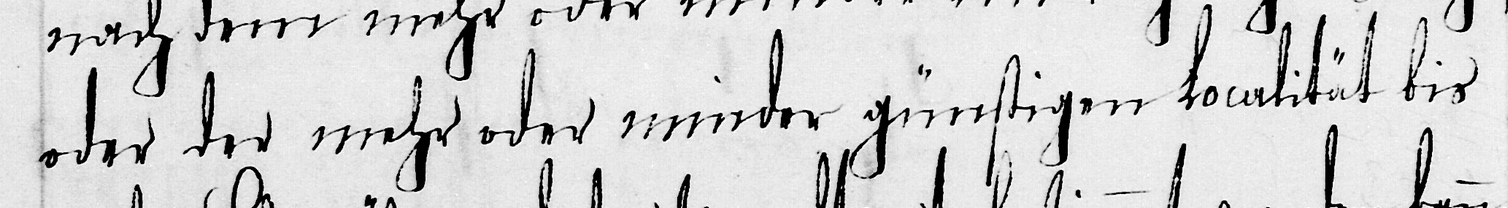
oder der mehr oder minder günstigen Localität bis
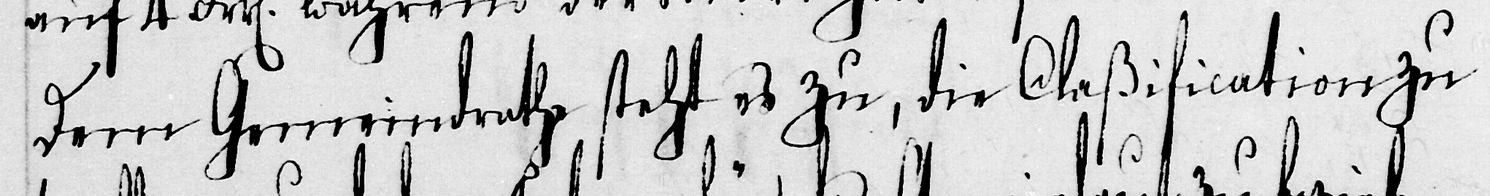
Dem Gemeindrathe steht es zu, die Claßification zu
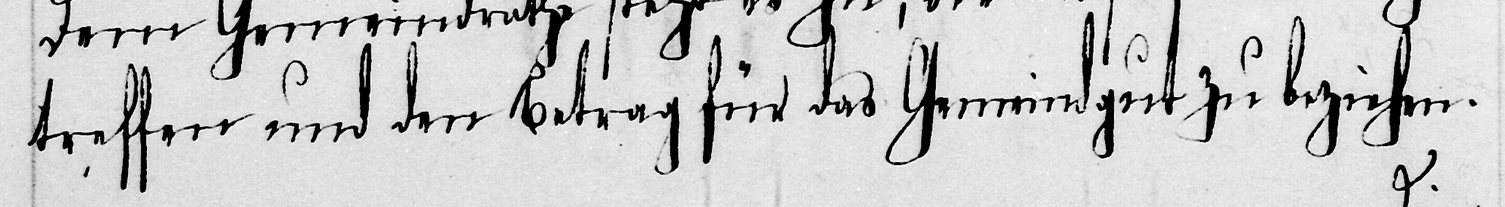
treffen und den Betrag für das Gemeindgut zu beziehen.
